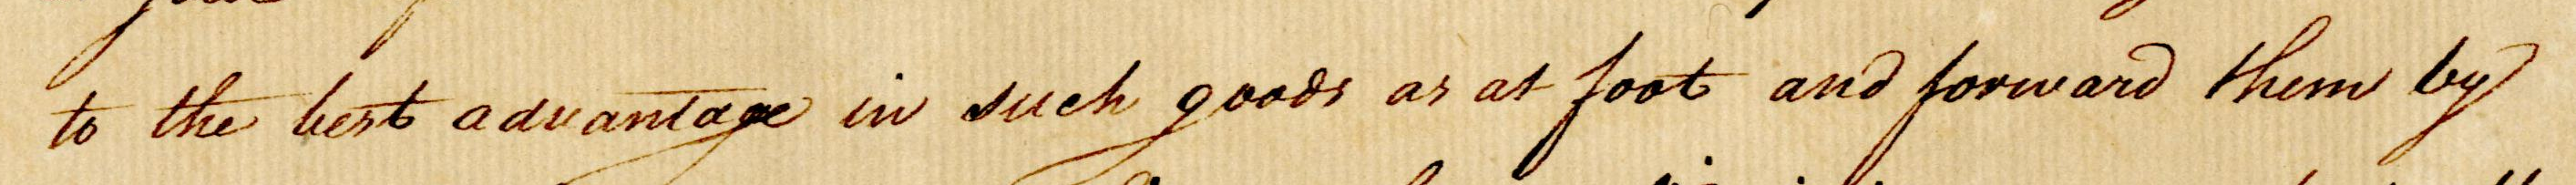to the best advantage in such goods as at foot and forward them by
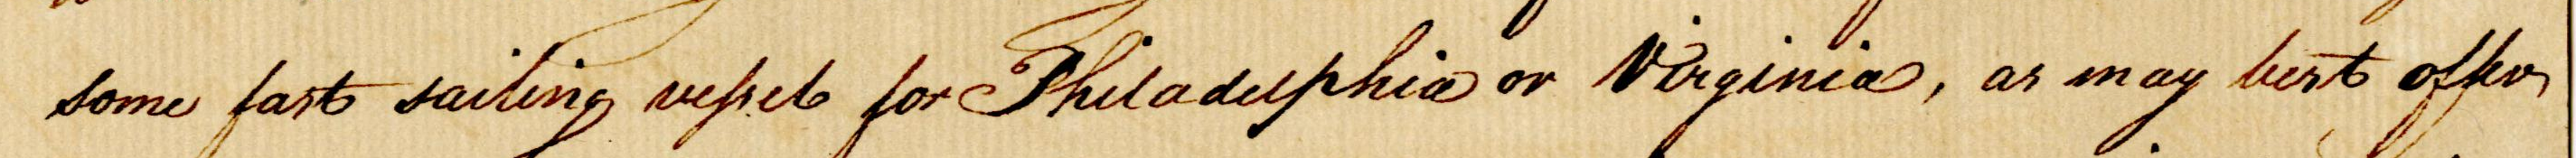some fast sailing vessel for Philadelphia or Virginia, as may best offer
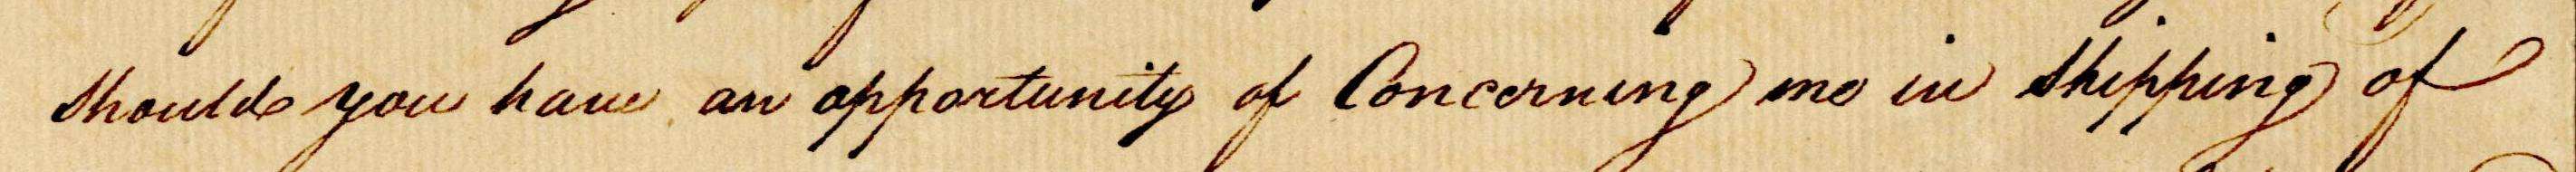should you have an opportunity of Concerning me in shipping of
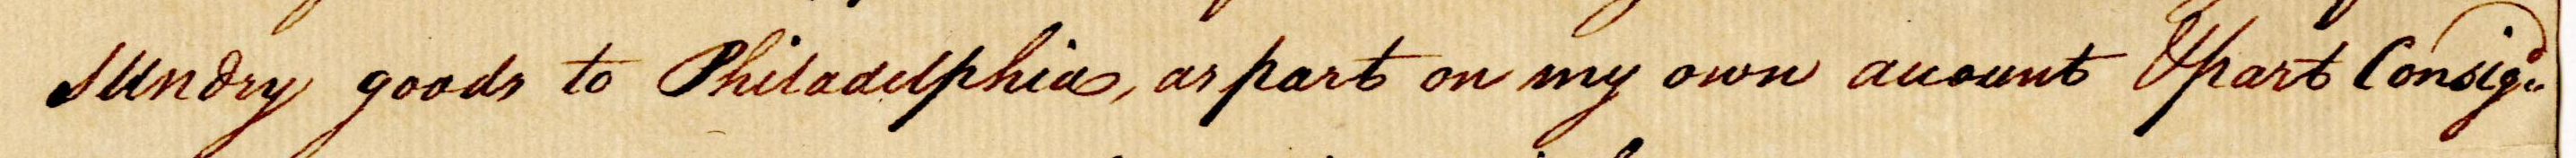Sundry goods to Philadelphia, as part on my own account & part Consign^d
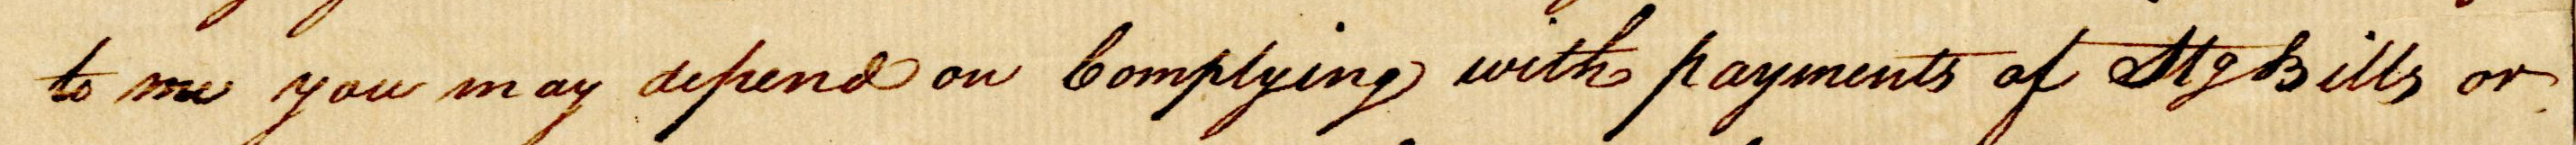to me you may depend on Complying with payments of Stg Bills or
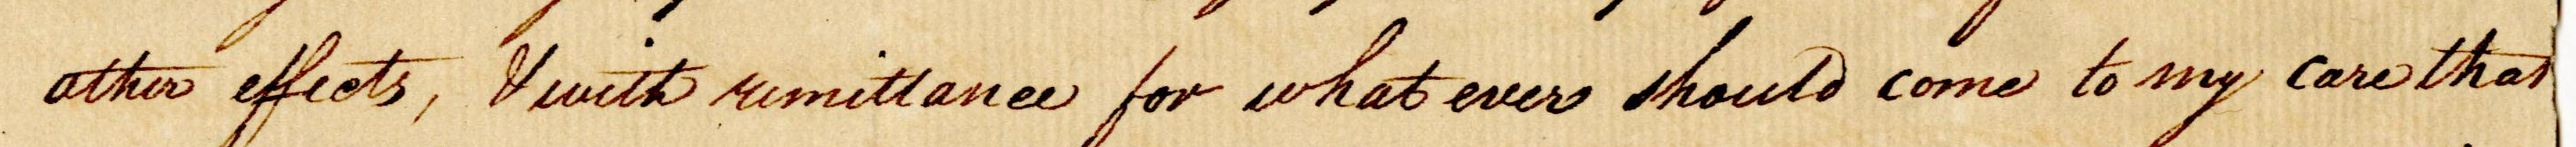other effects, & with remittance for what ever should come to my care that
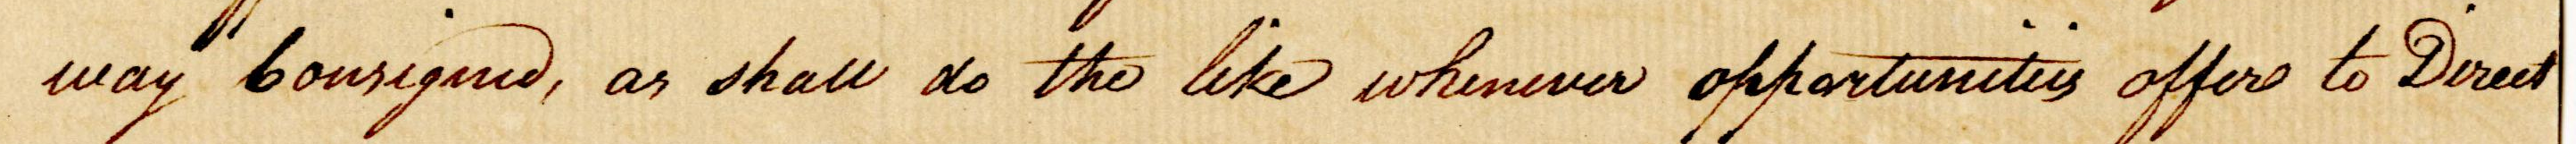way Consigned, as shall do the like whenever opportunities offer to Direct
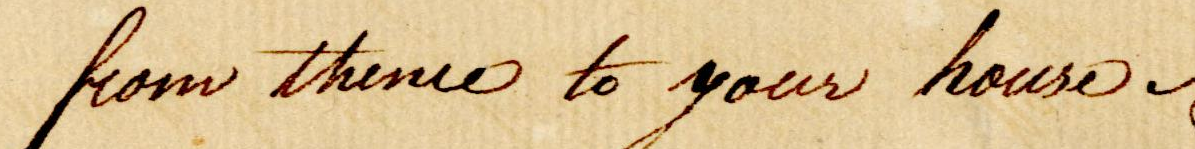from thence to your house.
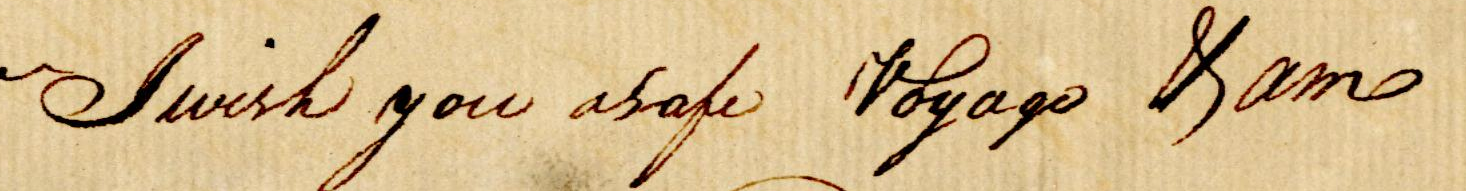I wish you a safe Voyage & am
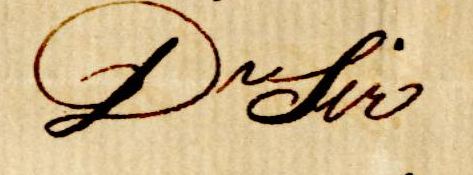D^r Sir
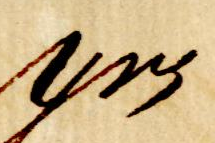Yrs
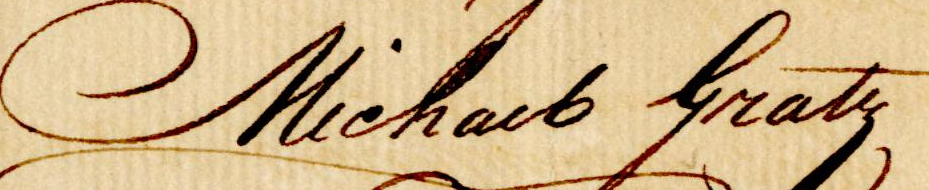Michael Gratz
